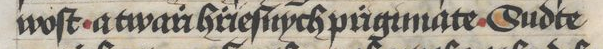woſt.a twaṙi hṙieſnych pṙigimate.Sudte
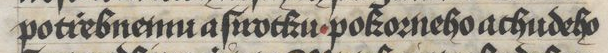potṙebnemu a ſirotku.pokorneho a chudeho
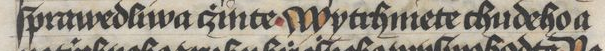ſprawedliwa cżinte.Wytrhniete chudeho a
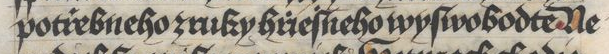potřebneho zruky hṙieẛneho wyſwobodte.Ne¬
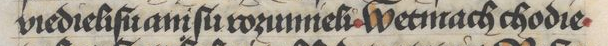viedieliſu ani ſu rozumieli.Wetmach chodie.
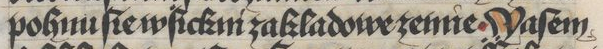pohnu ſie wẛickni zakladowe zemie.Yaſem
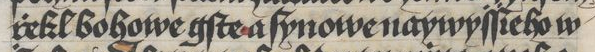ṙekl bohowe gſte.a ſynowe naywyẛẛieho w¬
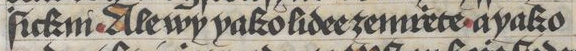ẛickni.Ale wy yako lidee zemṙete.a yako
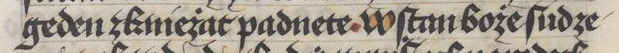geden zkníeżat padnete.Wſtan boże ſud ze¬
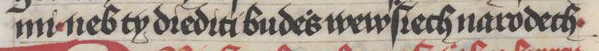mi.neb ty diediti budeṡ wewẛiech narodech.
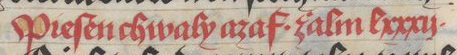Pieſen chwaly azaf.żalm lxxxij.
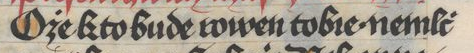Oże kto bude rowen tobie.nemlċ
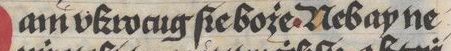ani vkrocug ſie boże.Nebay ne¬
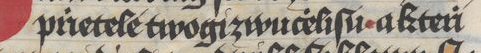pṙietelé twogi zwuċeliſu.a kteṙí
